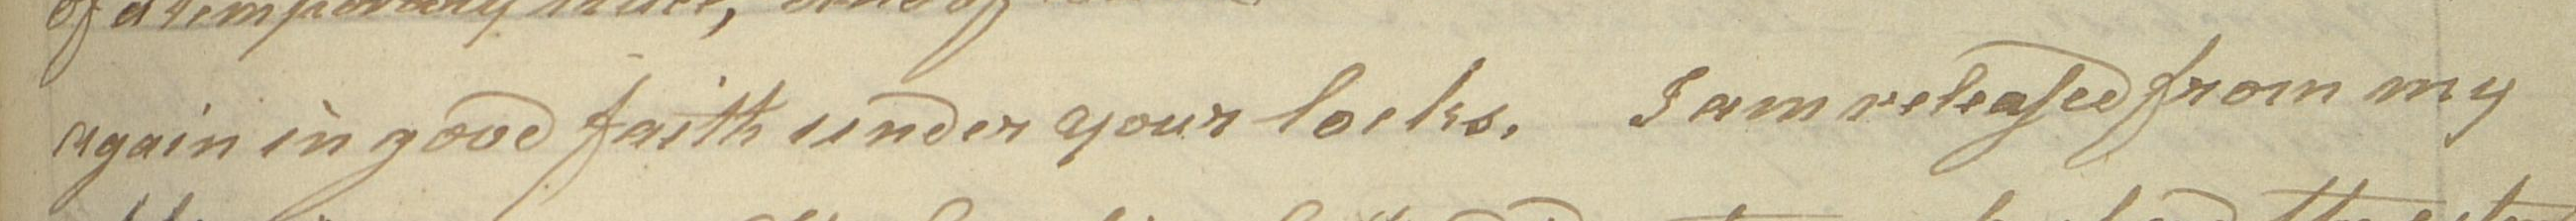again in good faith under your locks. I am released from my
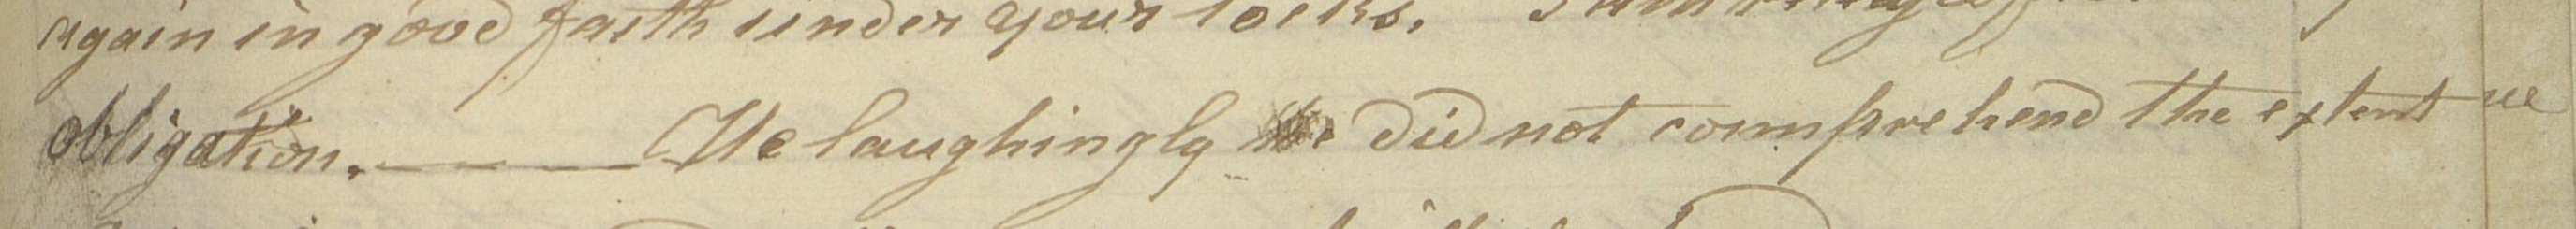obligation. We laughingly did not comprehend the extent we
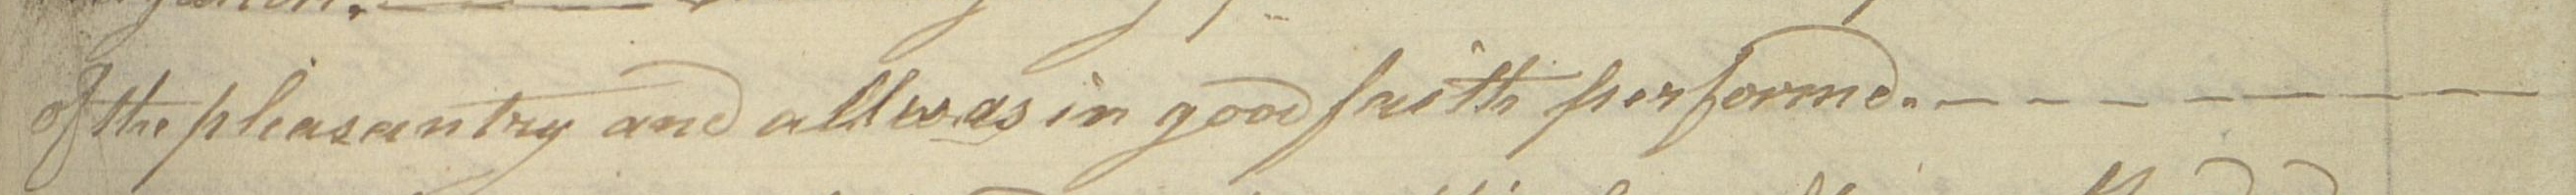of the pleasantry and all was in good faith performd.
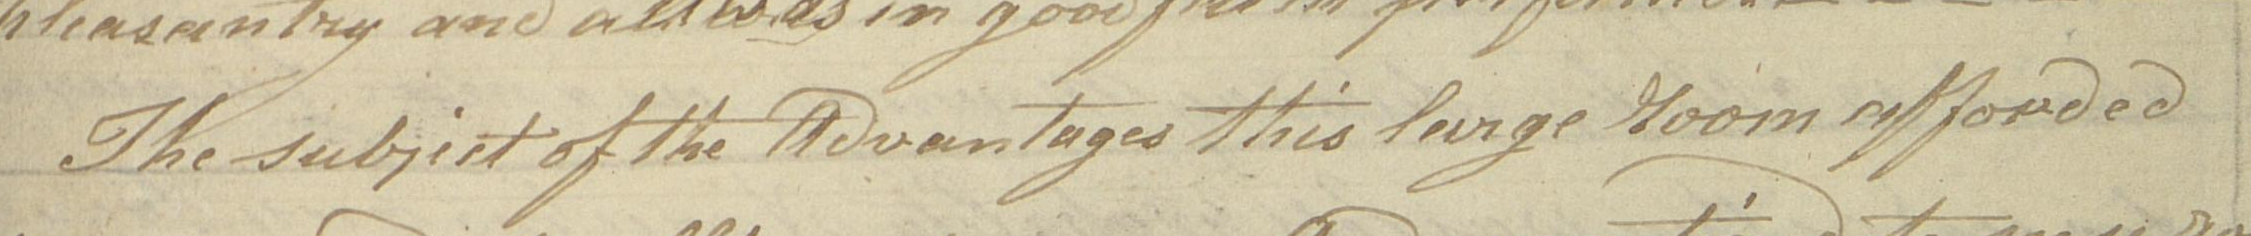The subject of the Advantages this large room afforded
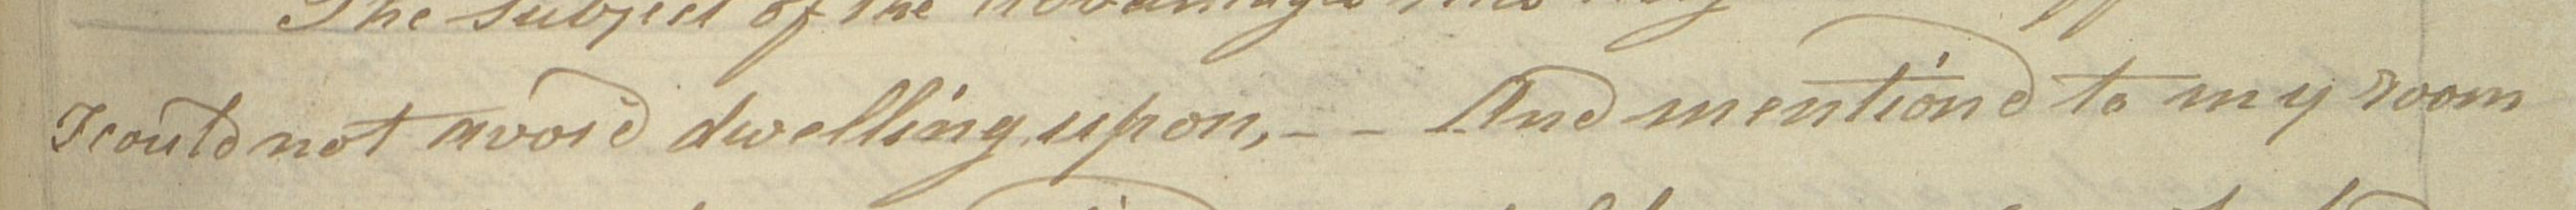I could not avoid dwelling upon, And mentiond to my room
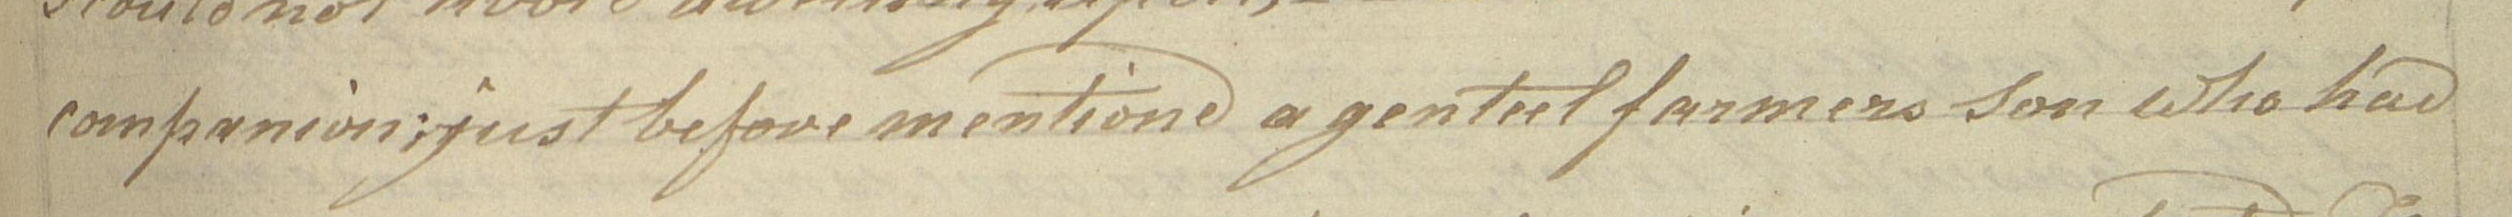companions; just before mentiond a genteel farmers son who had
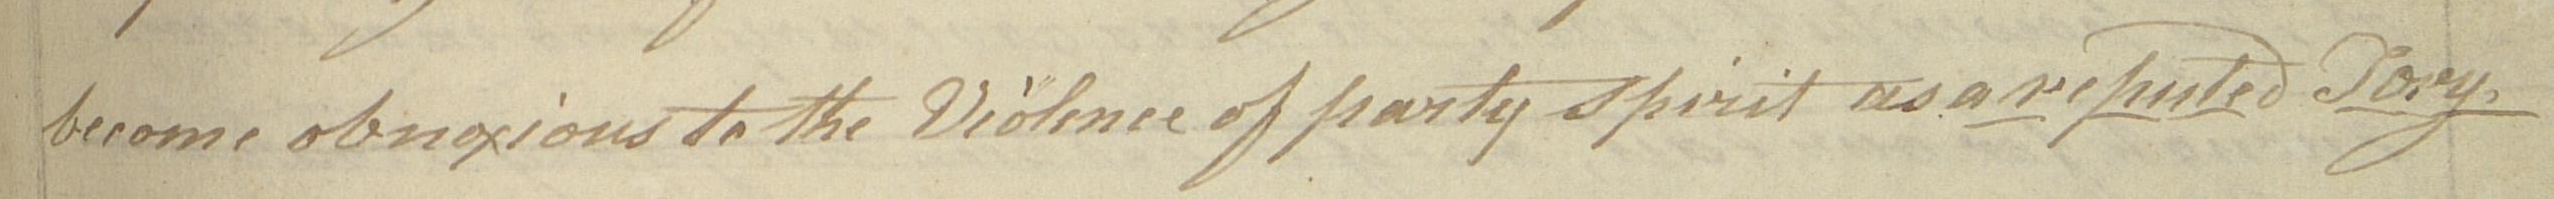become obnoxious to the Violence of party spirit as a reputed Tory,
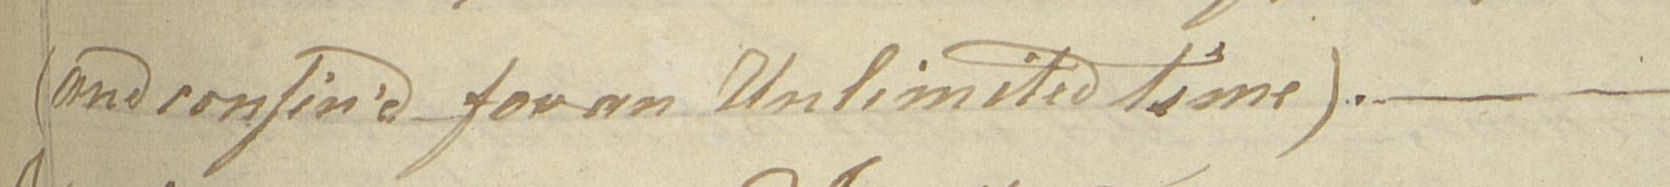and confin'd for an Unlimited time)
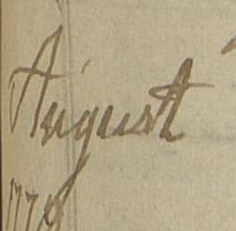August
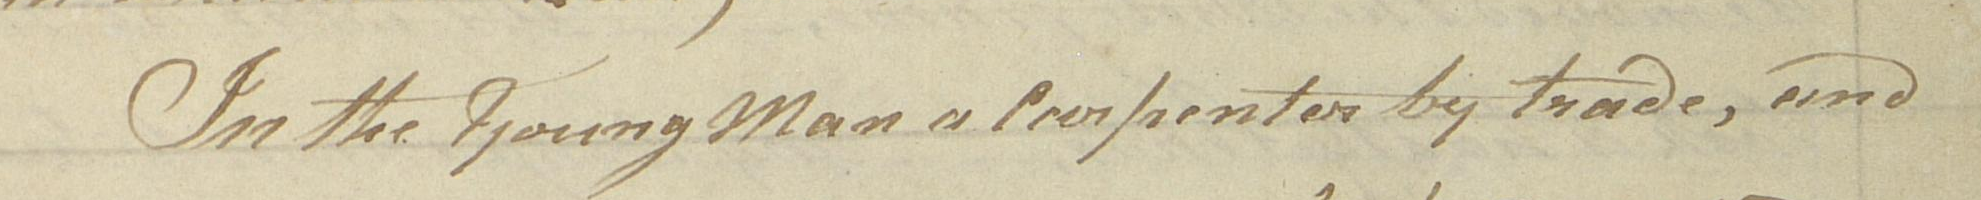In the Young Man a Carpenter by trade, and
